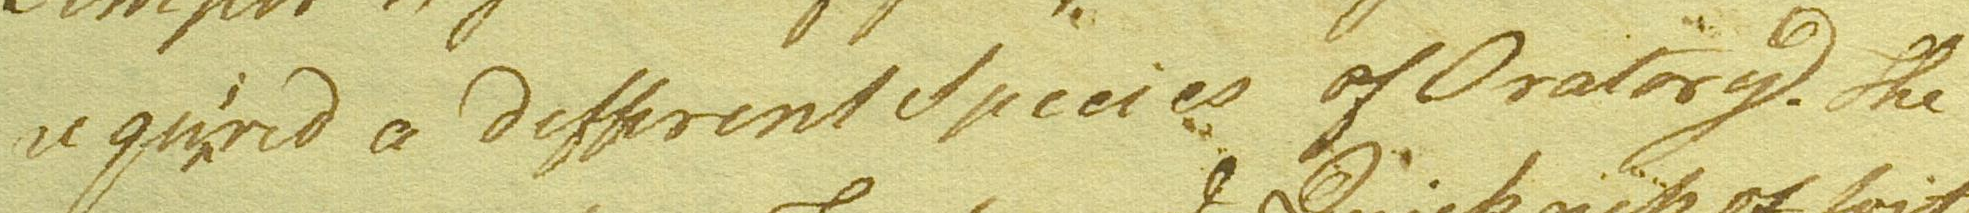requir'd a different Species of Oratory. The
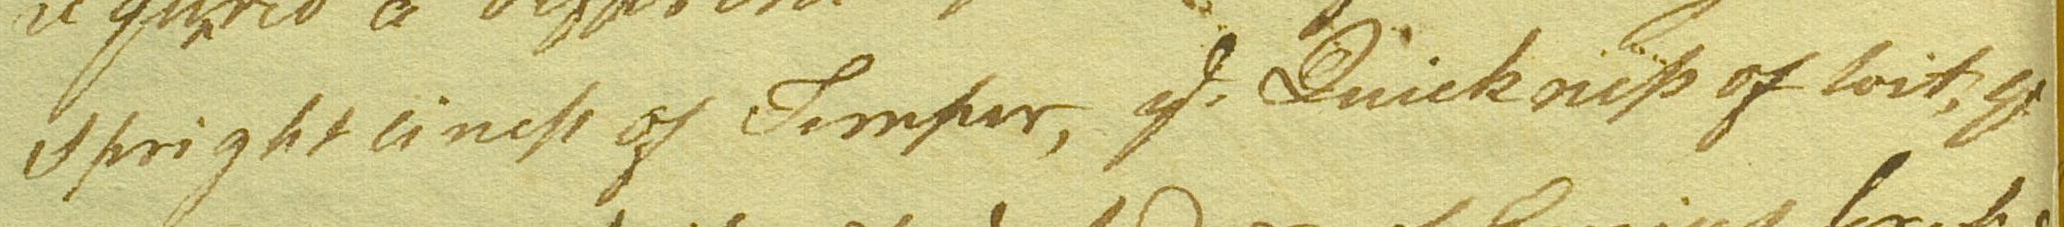sprightliness of Temper, y^e Quickness of wit, y^e
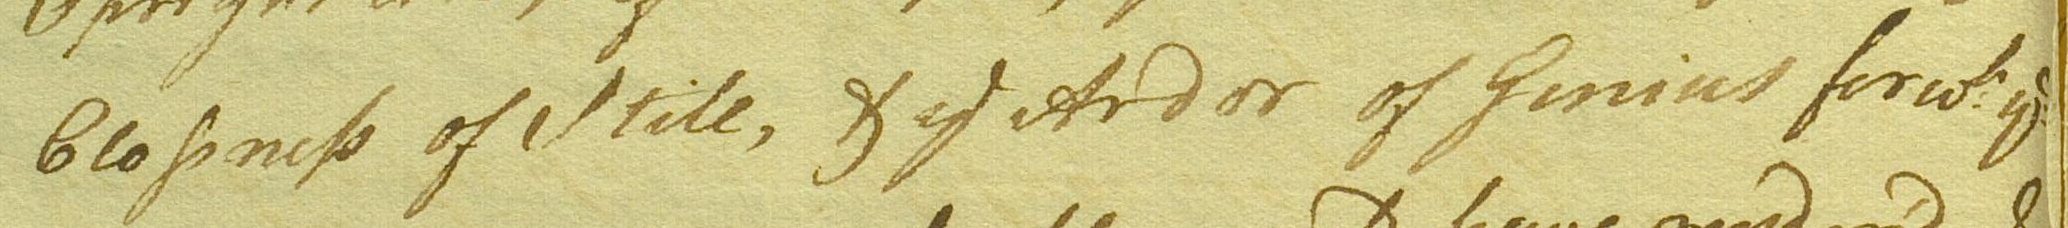Closeness of Stile, & y^e Ardor of Genius for w^h y^e
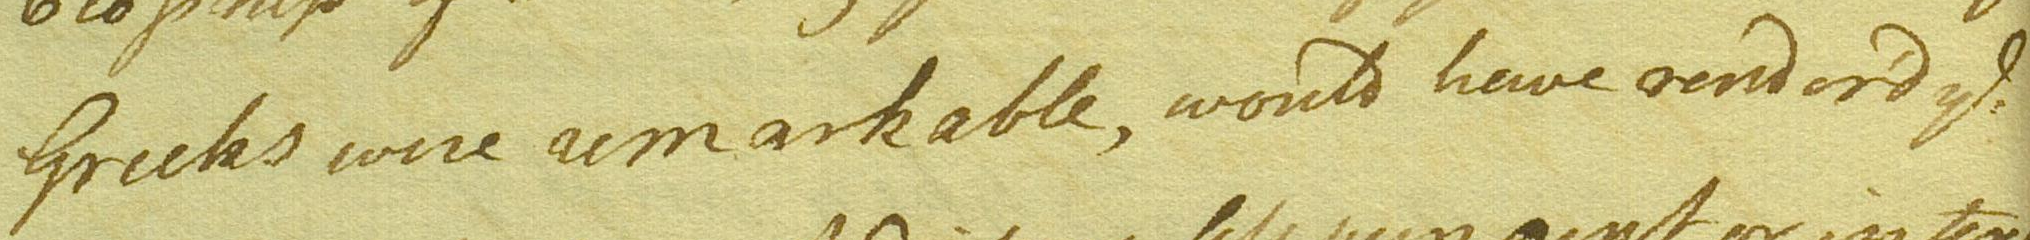Greeks were remarkable, would have render'd y^e
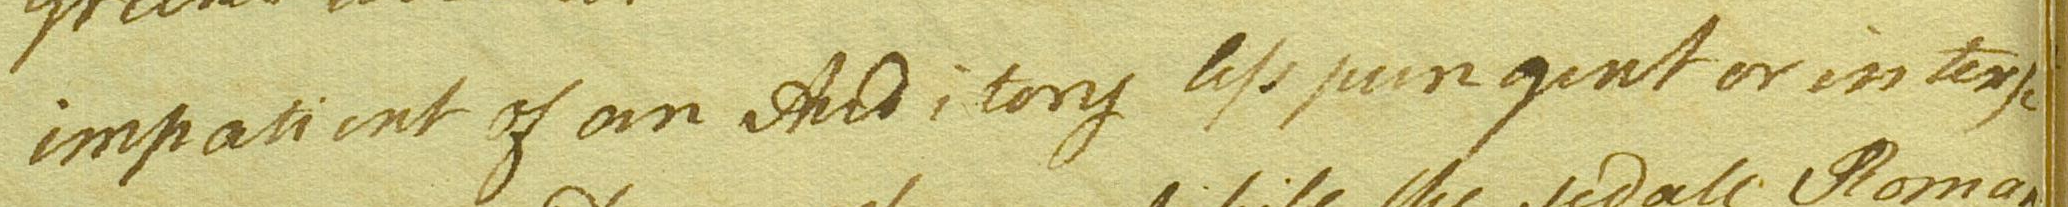impatient of an Auditory less pungent or in text
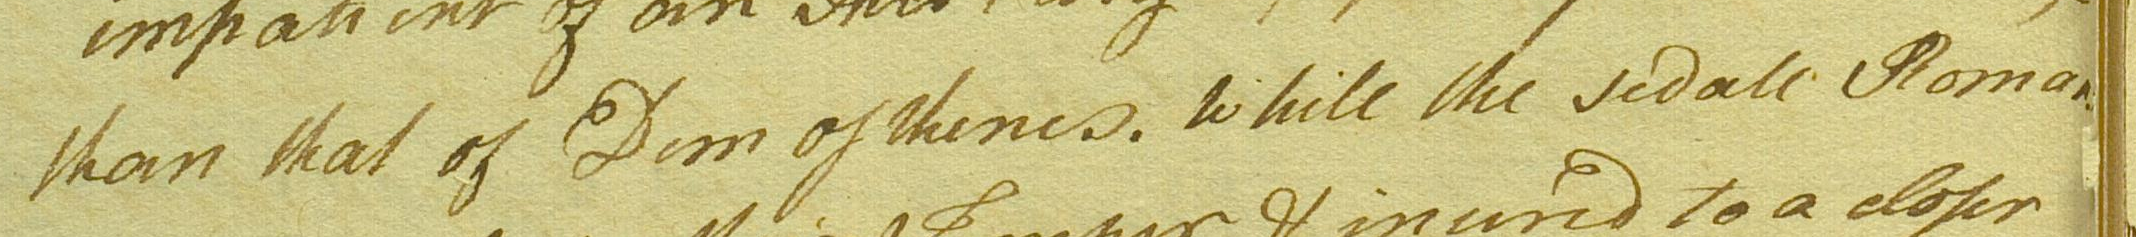than that of Demosthenes. While the sedate Roman
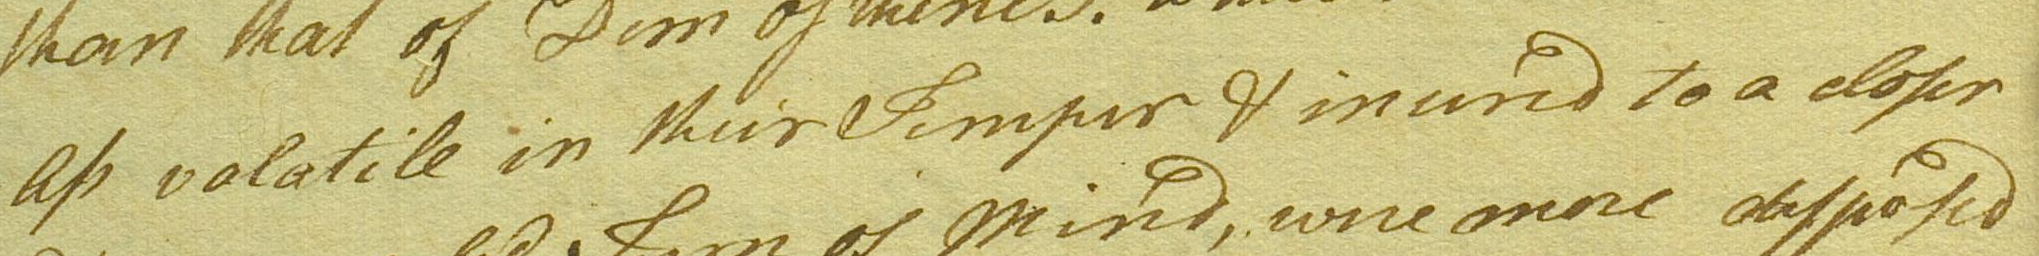As volatile in their Temper & inured to a closer
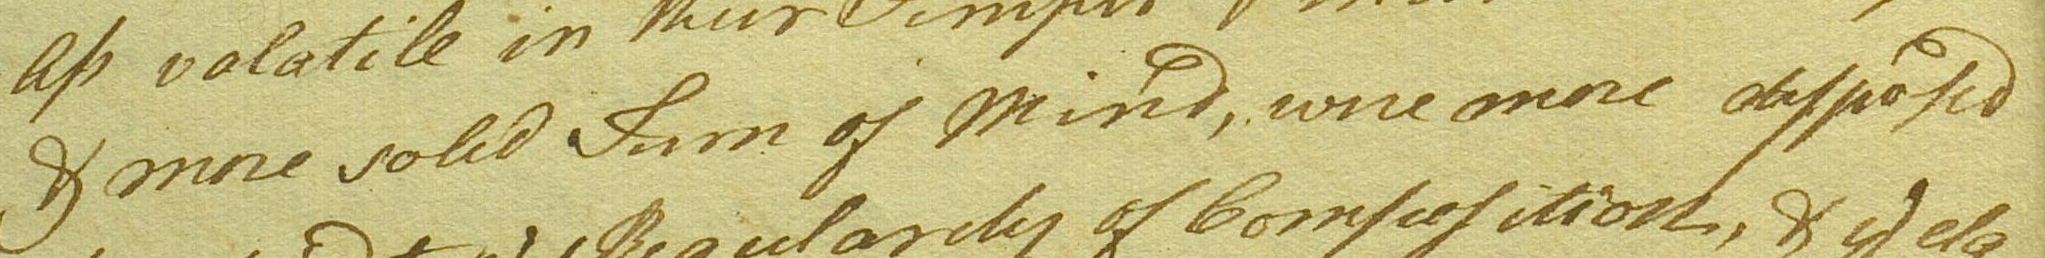& more solid Turn of Mind, were more desposed
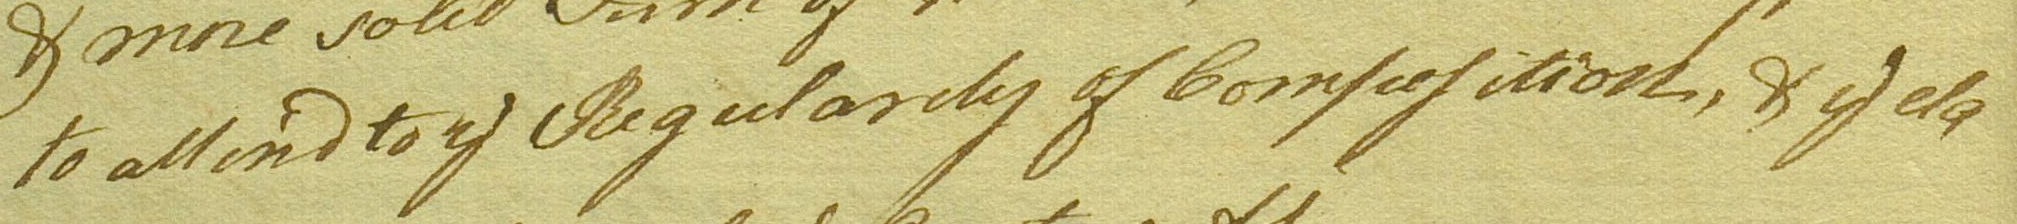to attend to y^e Regularity of Composition, & y^e ela-
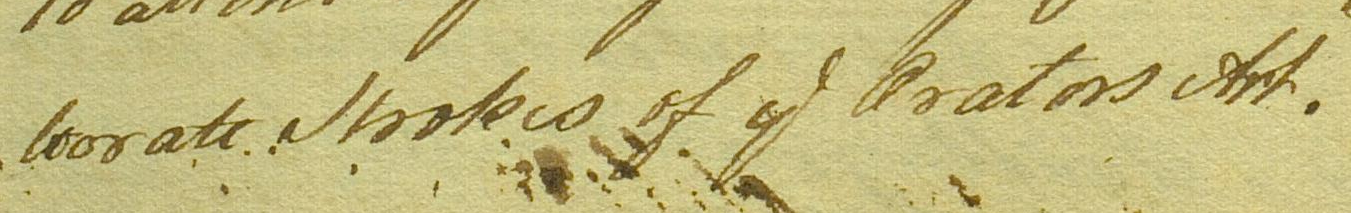borate Strokes of y^e Orators Art.
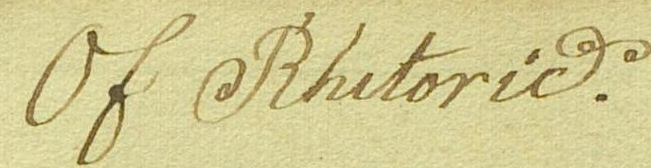Of Rhetoric.
